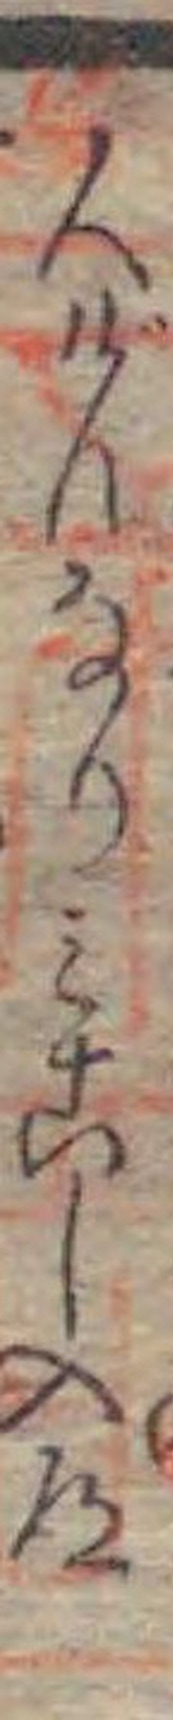人げんなりみこし入道
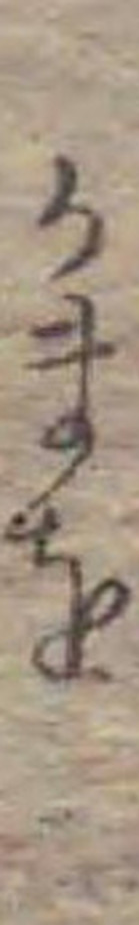かまを
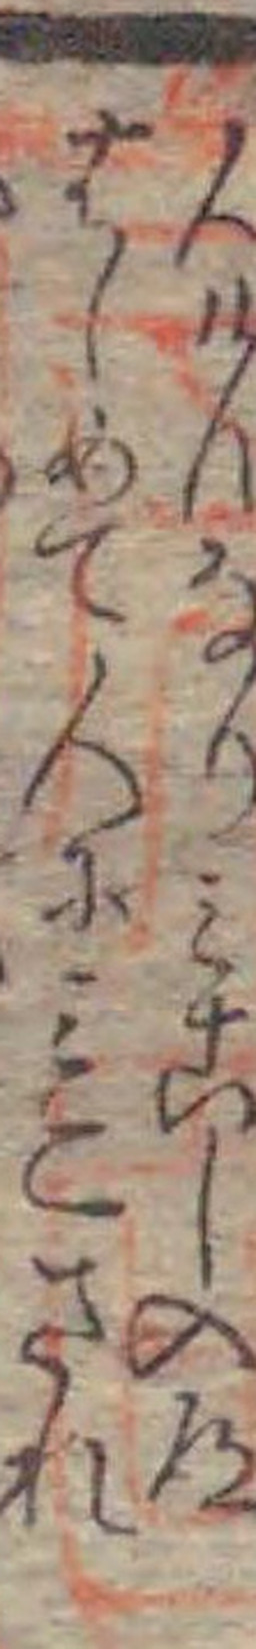はしめて人にみこされ
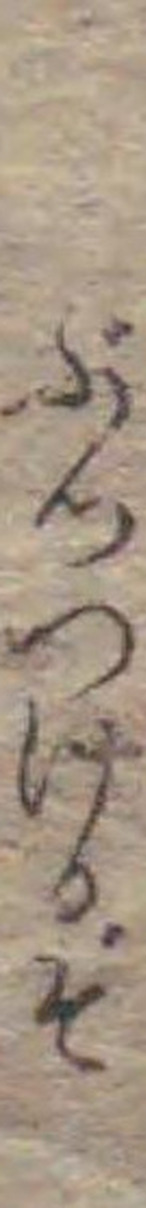ぶつつけるぞ
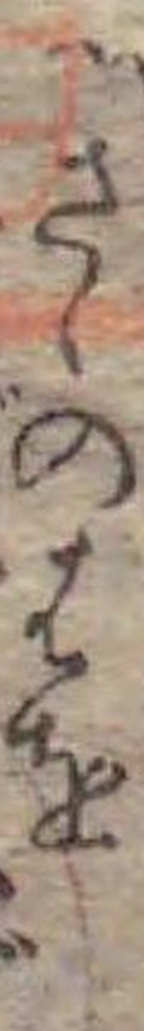〽さゝのはを
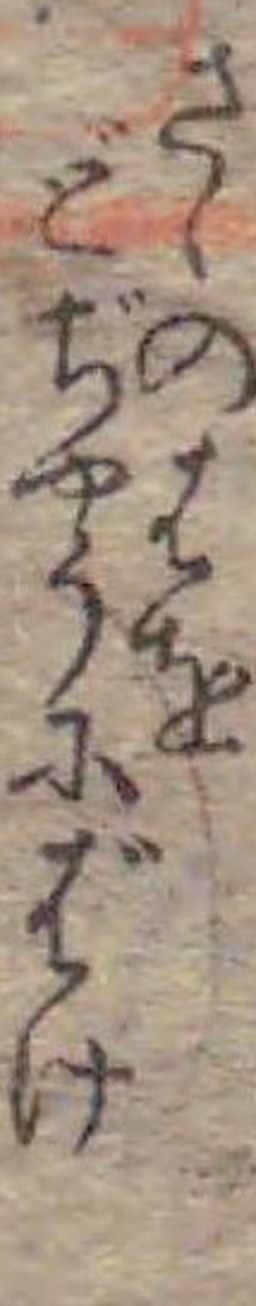どぢやうにばけ
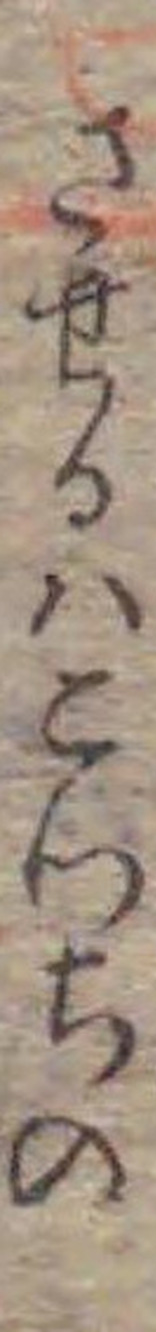させるはこつちの
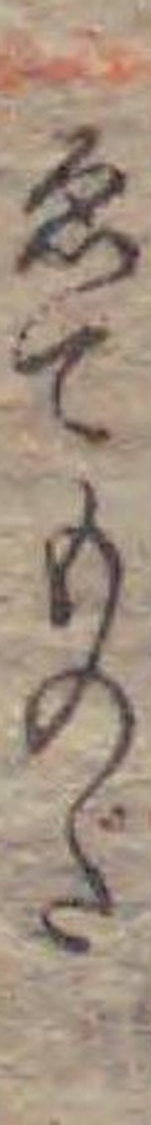ゑてものだ

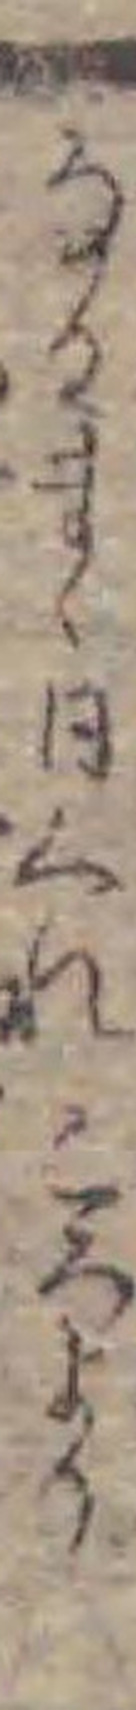なるまゝ日くれころより
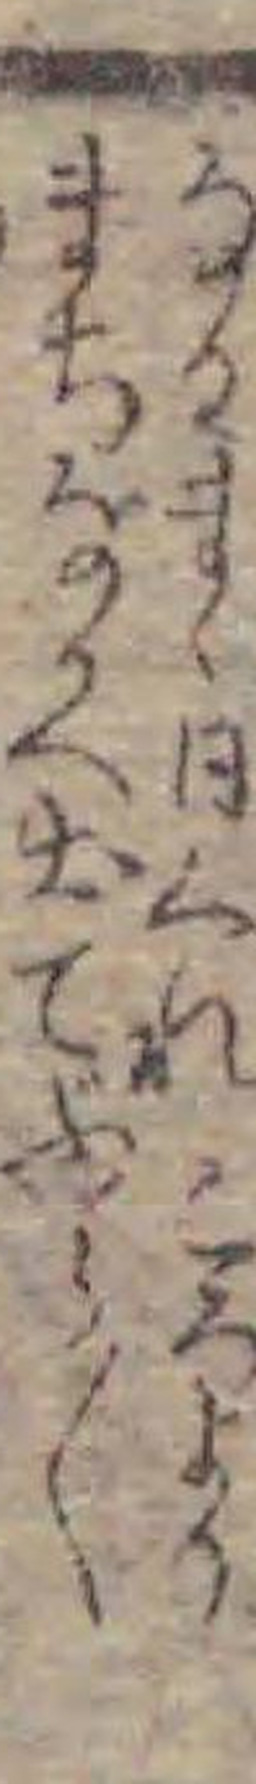まちなかへ出てぶら〳〵
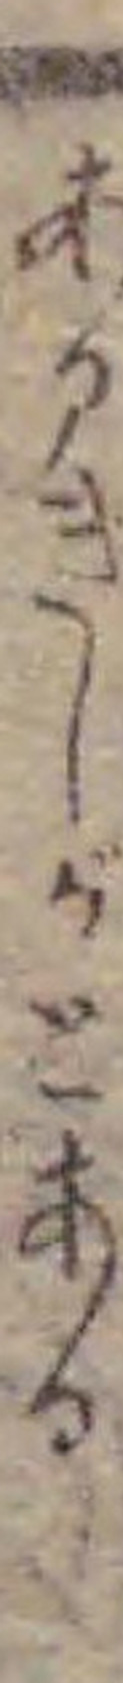あるきしがとある
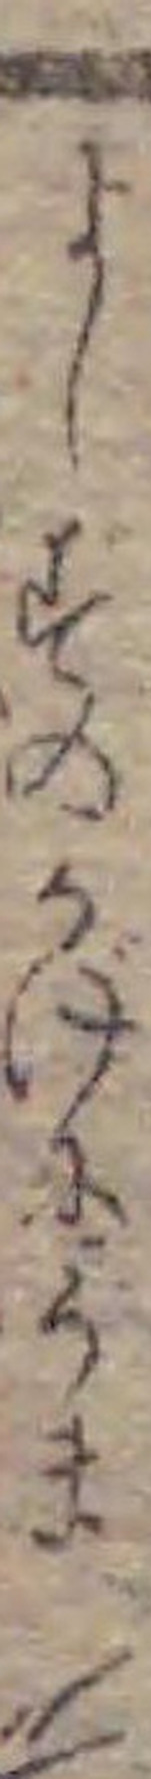よしすのかげにうま
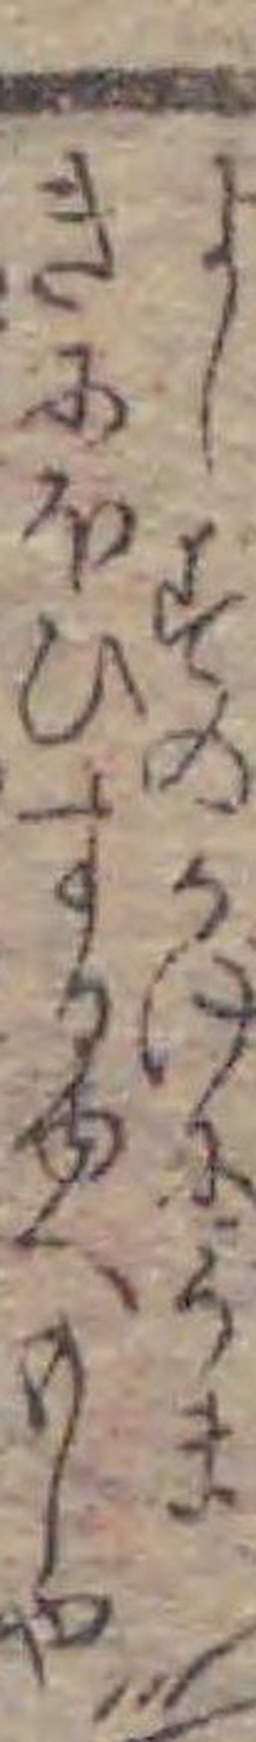きにほひするゆへもしや
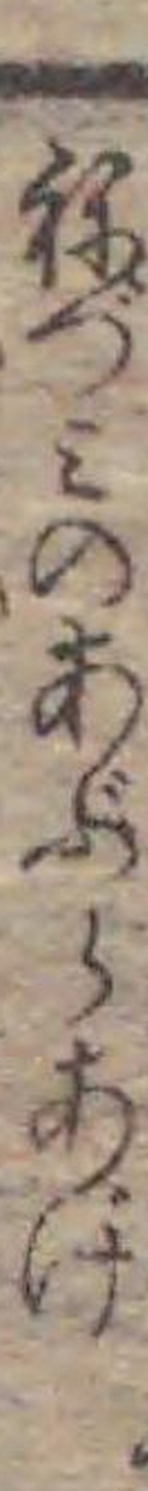ねづみのあぶらあげ
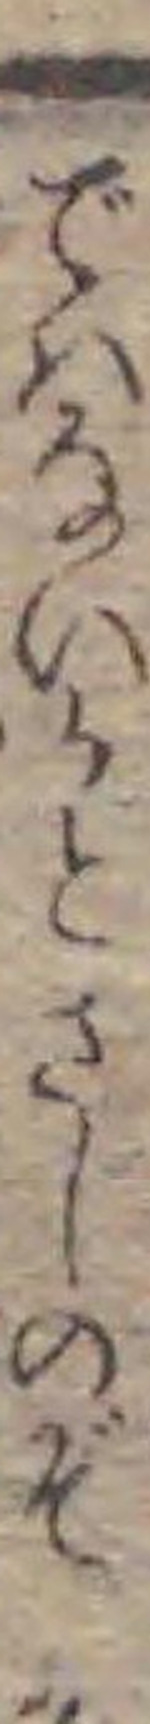ではないかとさしのぞ
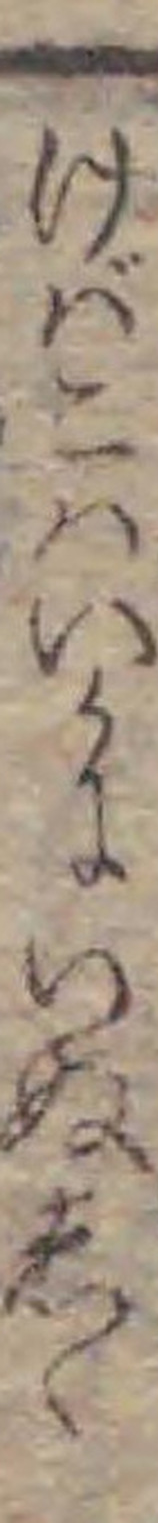けばこはいかにいぬしゝ
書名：怪物つれつれ草 : 2巻
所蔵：国立国会図書館 National Diet Library, JAPAN
